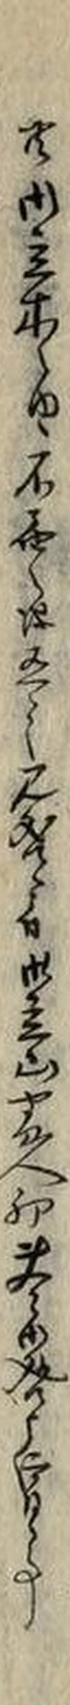共御立木之内へ不届之儀有之見咎候ニ付御立山番人初夫々御咎被仰付候事
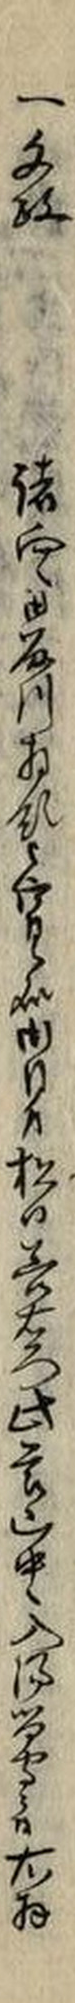一文政諸向へ御留川拝領被仰付候処御目付松田善右衛門此節山中へ入湯留守ニ付右拝
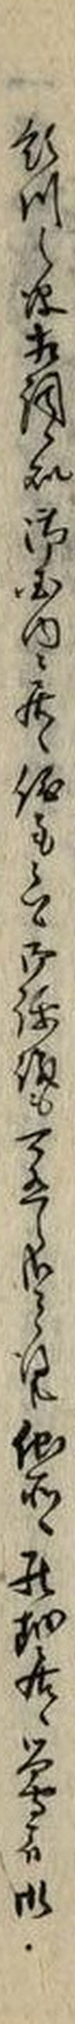領川之儀相伺候処御国内ニ居候儀にも候ハヽ御評議も可有之哉ニ候得共他所へ罷越居候留守ニ付御
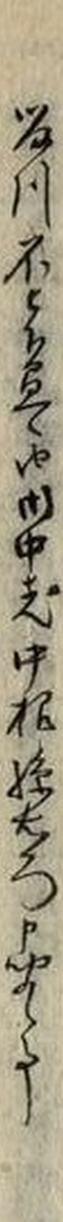留川不被下置候由御中老中根孫右衛門申聞候事
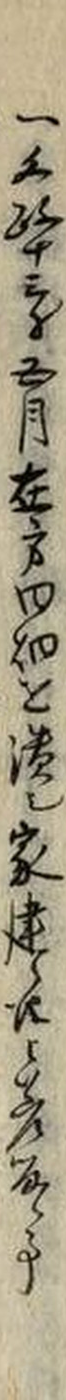一文政十三寅五月在方田畑を潰シ家建候儀差留候事
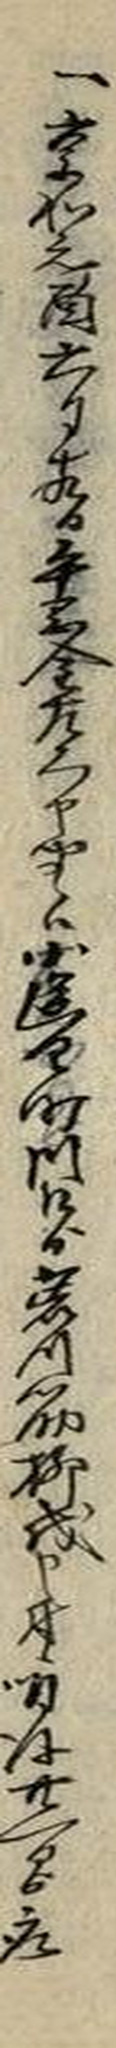一享和元酉六月十九日平岡金左衛門申聞候ハ小道具町川口ゟ荒川筋柳伐申付候明後廿一日ゟ取
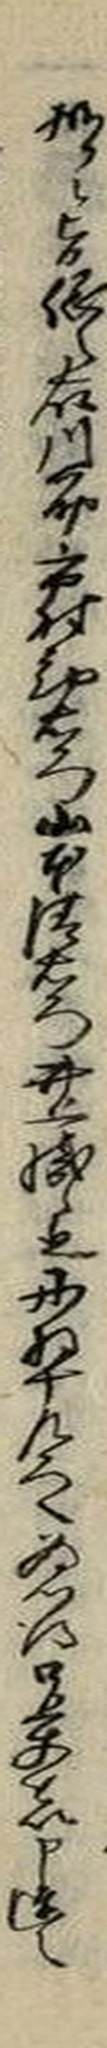掛り候旨依之右川筋市村勘右衛門山本清右衛門井上織之丞丹羽十左衛門へ為心得口上使を以申達候
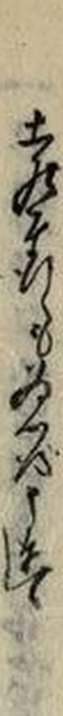土居奉行へも為心得申達候
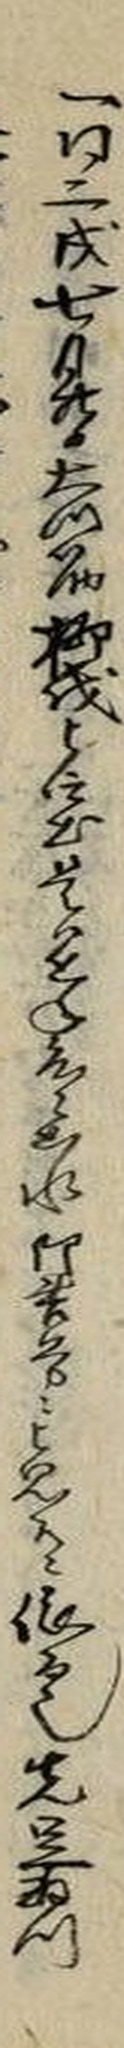一同二戌七月廿日大川筋柳伐被仰出是ハ近年度々出水御苦労ニ被思召ニ依而也先足羽川
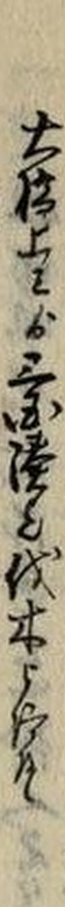大橋上ミゟ三国湊迄伐木被仰付候
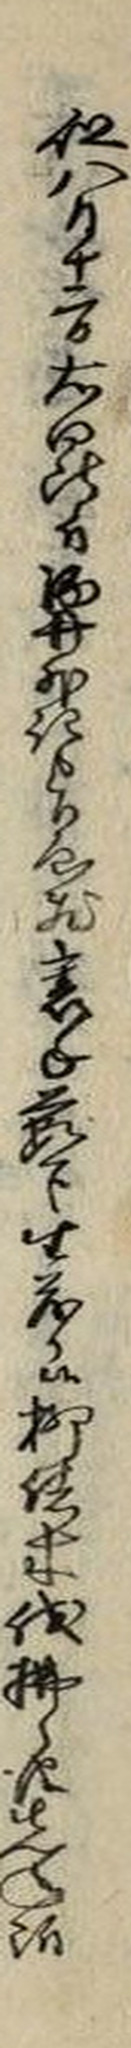但八月十二日右同断ニ付酒井外記方下屋敷裏手薮下生茂り候柳諸木伐払候儀先年附
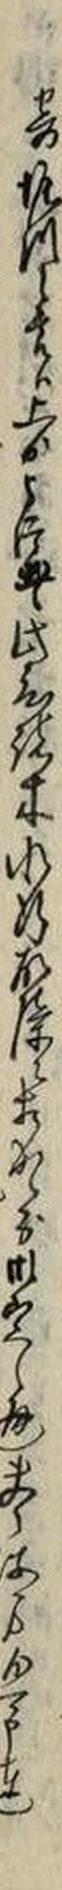寄堀川之節ハ上ゟ被仰出候此度諸木水行故障ニ相成候分御定之通夫々役方ゟ可申達
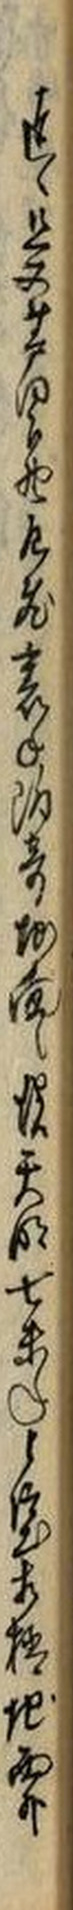達候且又芦田下野屋敷裏手附寄地面之儀ハ天明七未年被仰出相極候地面外
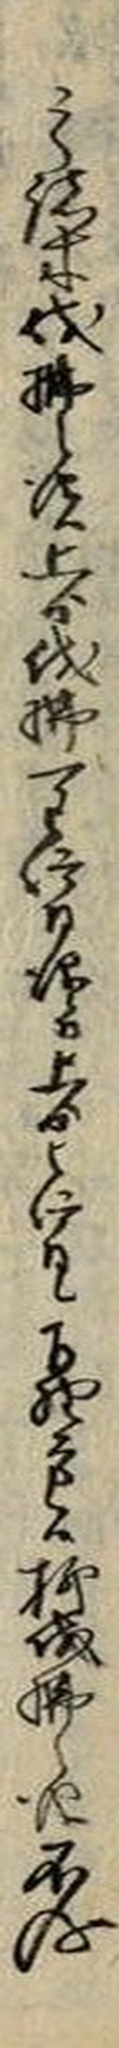之諸木伐払之儀ハ上ゟ伐払可被仰付儀ニ付上ゟ被仰付候下野方へハ柳伐払之儀不及
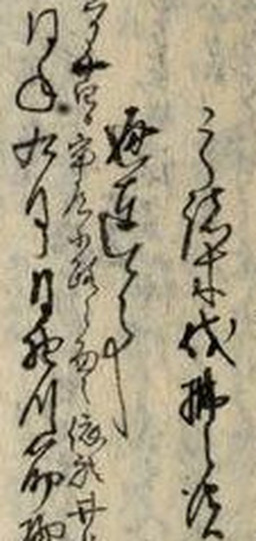通達候事
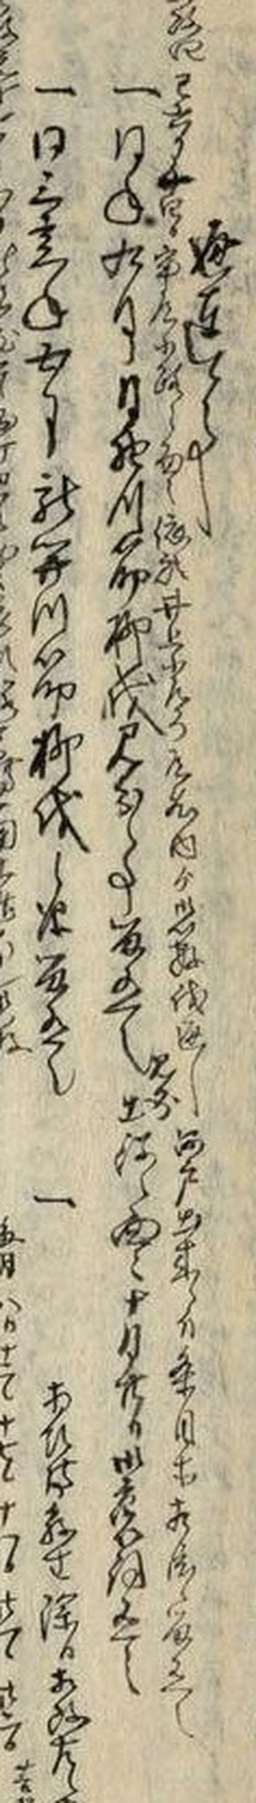一同年九月日野川筋柳伐見分之事留有之見分出役之面々十月廿日御褒詞有之
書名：御国他国諸事之部
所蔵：福井県文書館 Fukui Prefectural Archives
